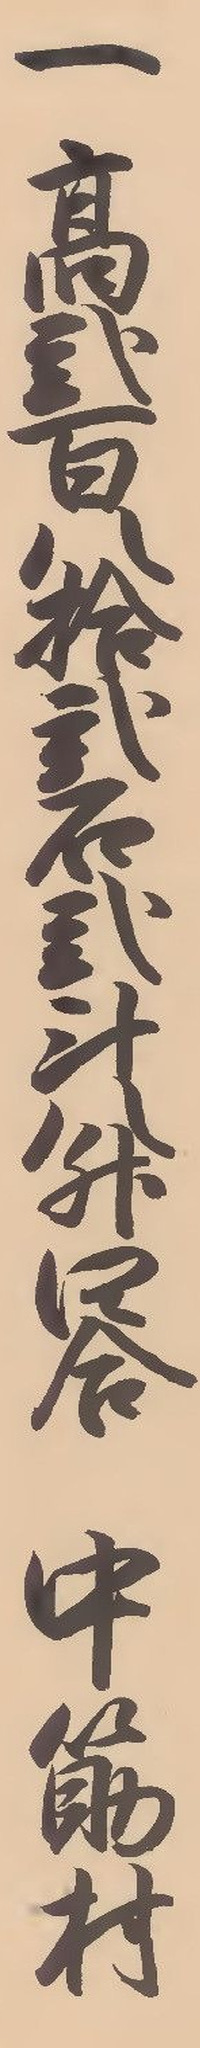一高弐百八拾弐石弐斗八升四合中筋村

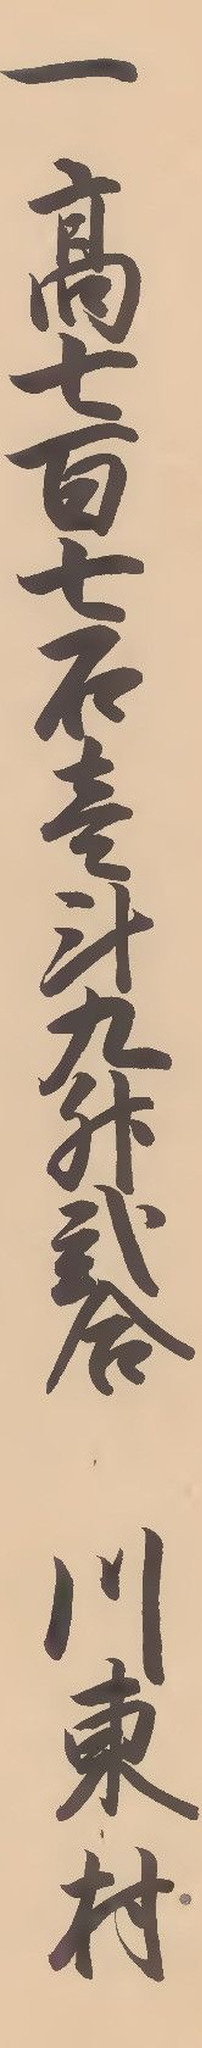一高七百七石壱斗九升弐合川東村
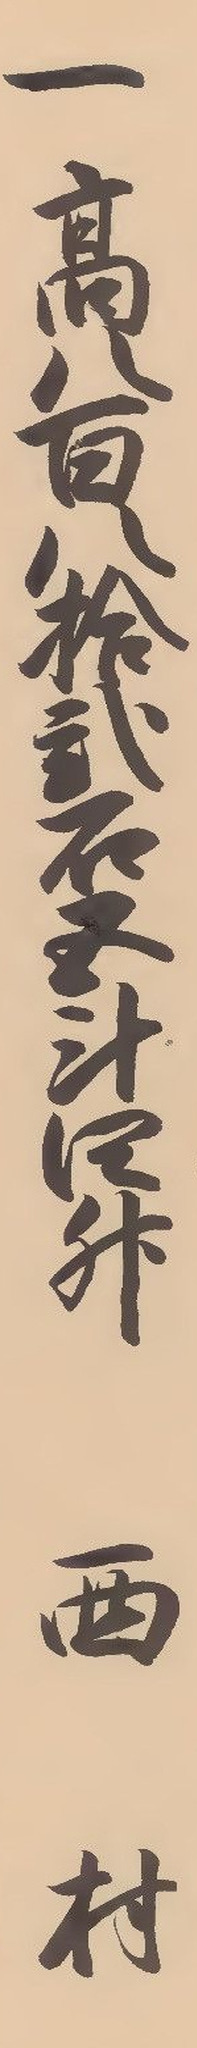一高八百八拾弐石五斗四升西村
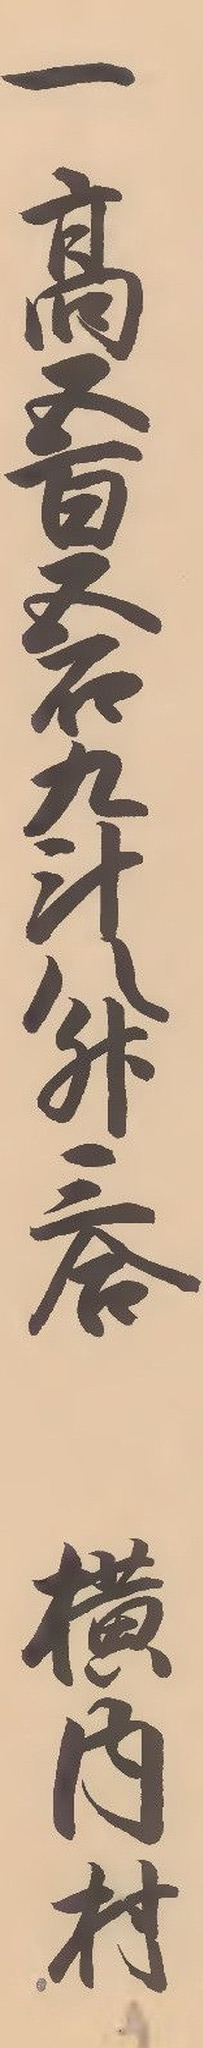一高五百五石九斗八升三合横内村
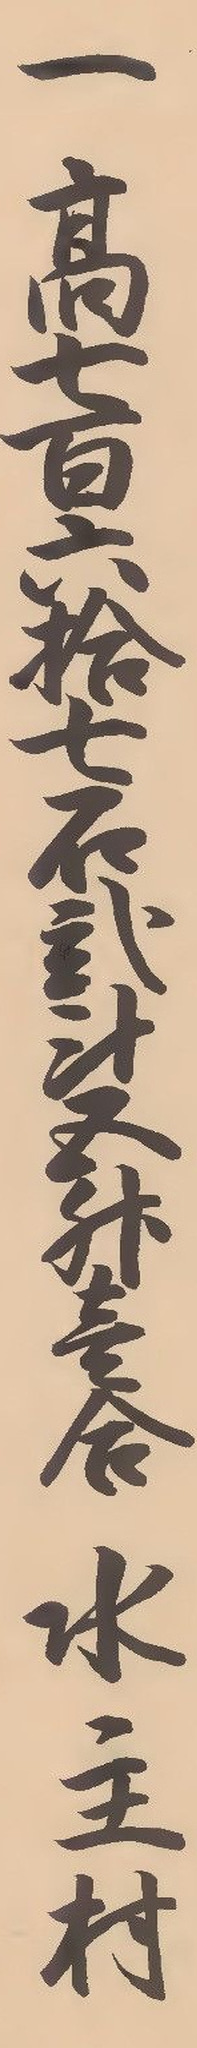一高七百六拾七石弐斗五升壱合水主村
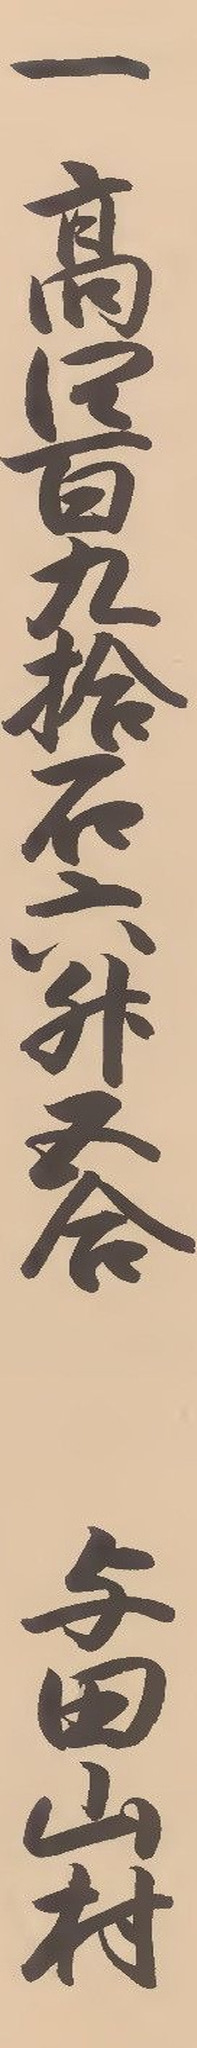一高四百九拾石六升五合与田山村
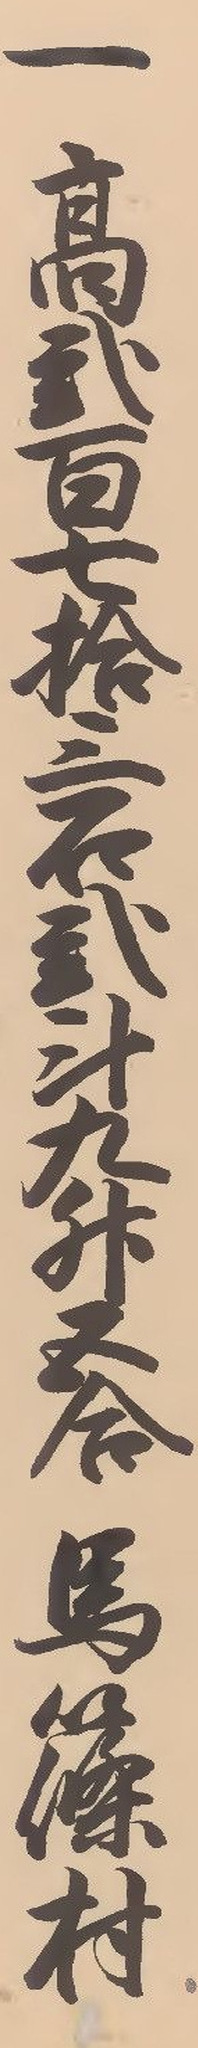一高弐百七拾三石弐斗九升五合馬篠村
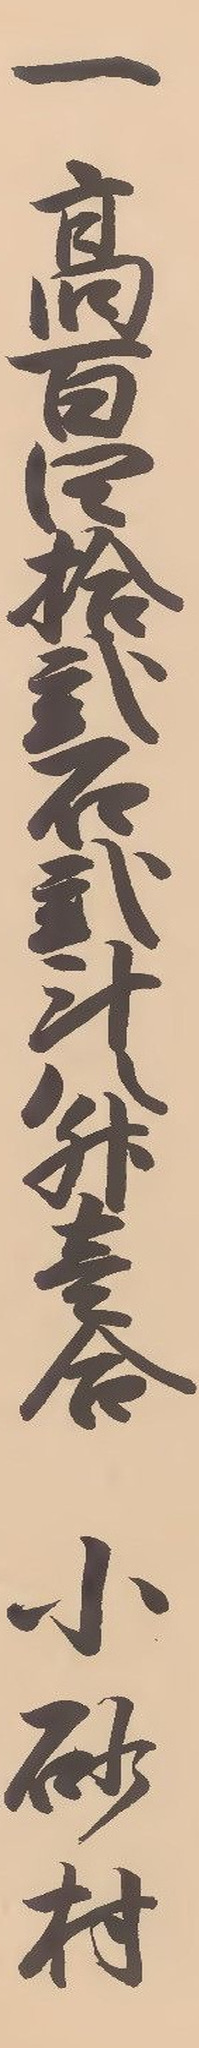一高百四拾弐石弐斗八升壱合小砂村
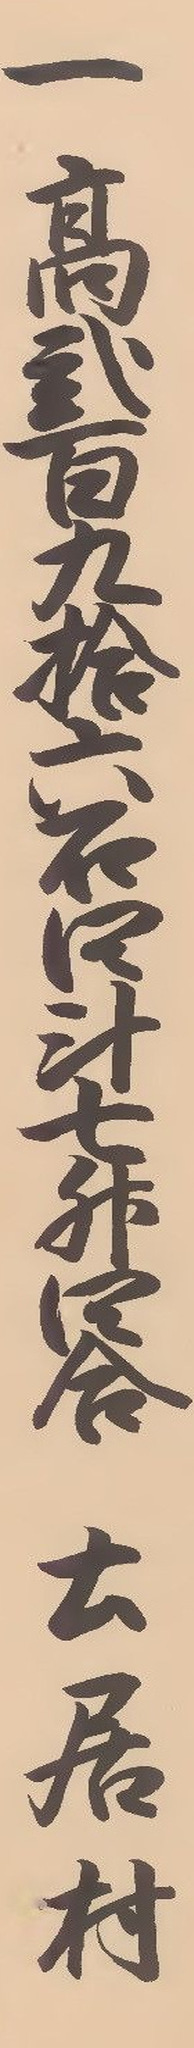一高弐百九拾六石四斗七升四合土居村

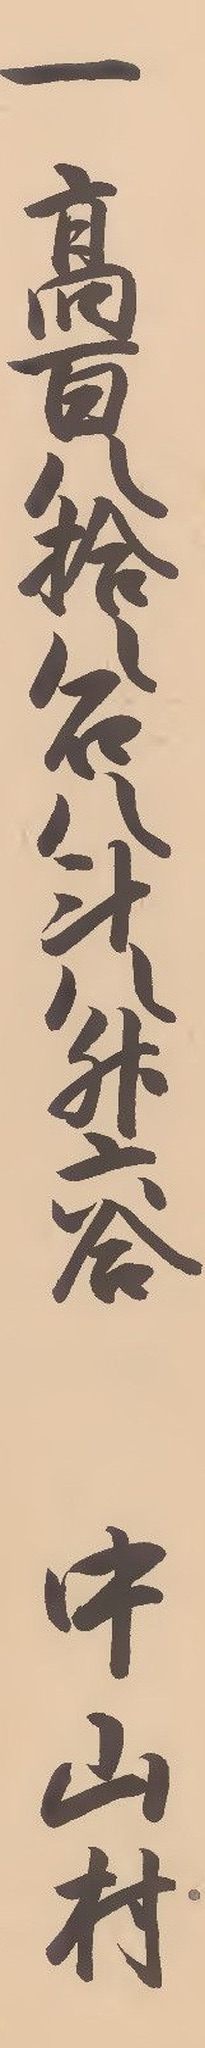一高百八拾八石八斗八升六合中山村
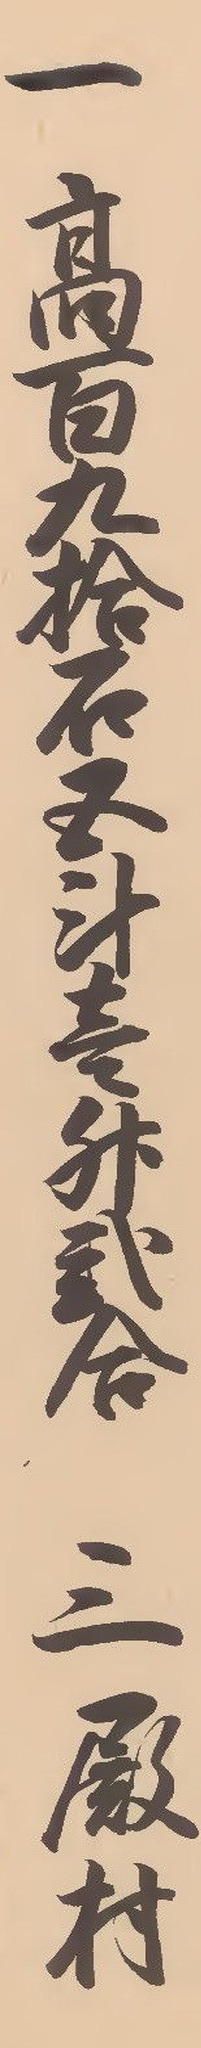一高百九拾石五斗壱升弐合三殿村
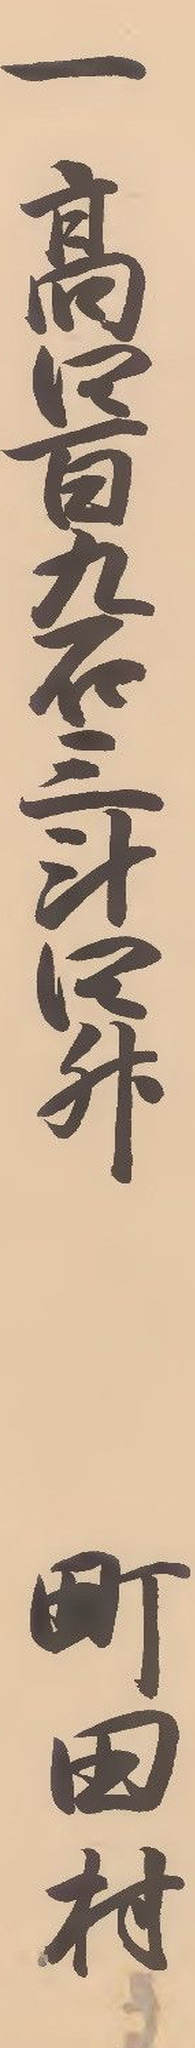一高四百九石三斗四升町田村
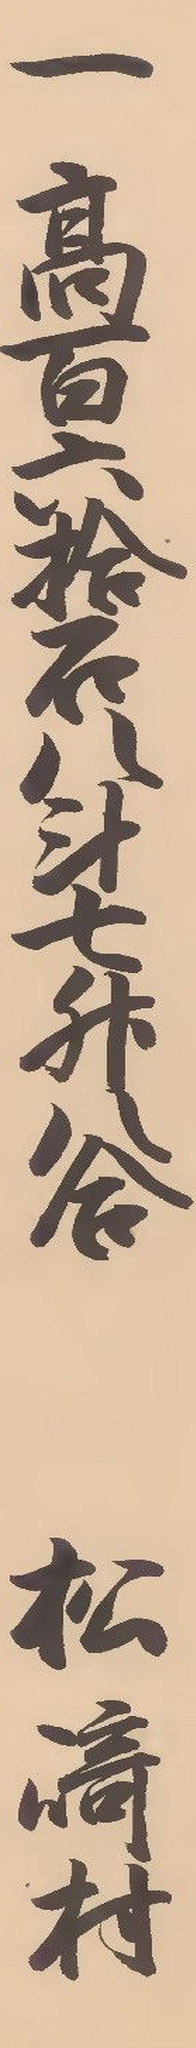一高百六拾石八斗七升八合松崎村
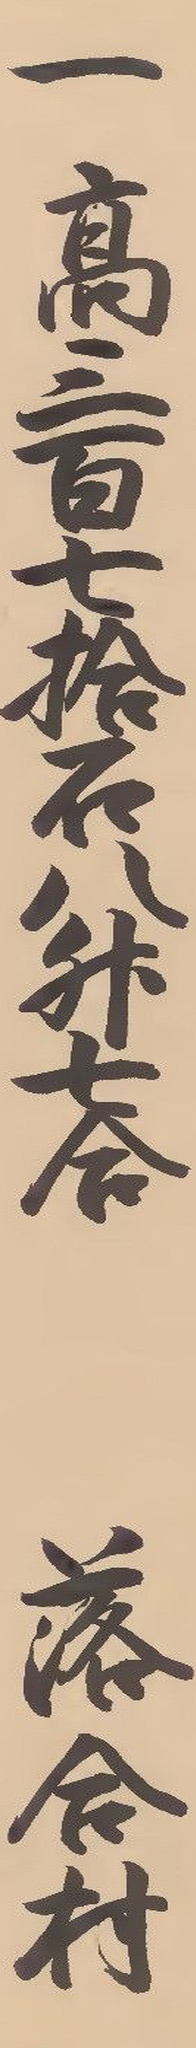一高三百七拾石八升七合落合村
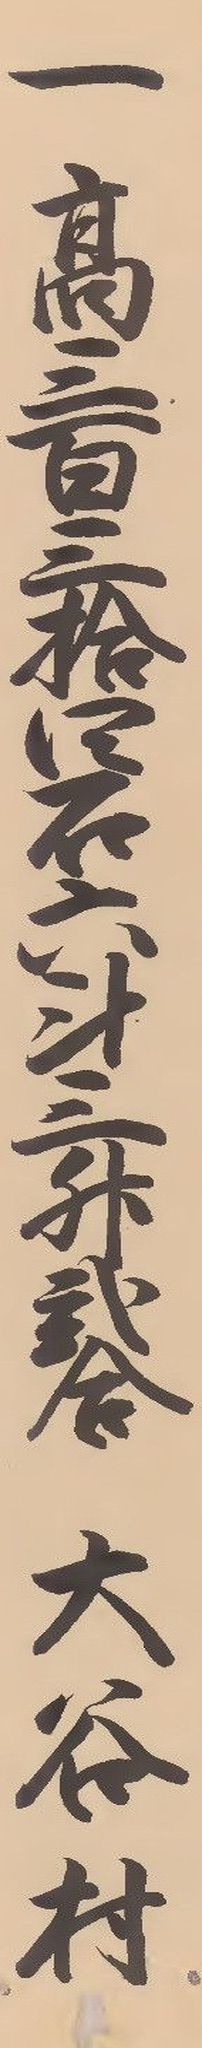一高三百三拾四石六斗三升弐合大谷村
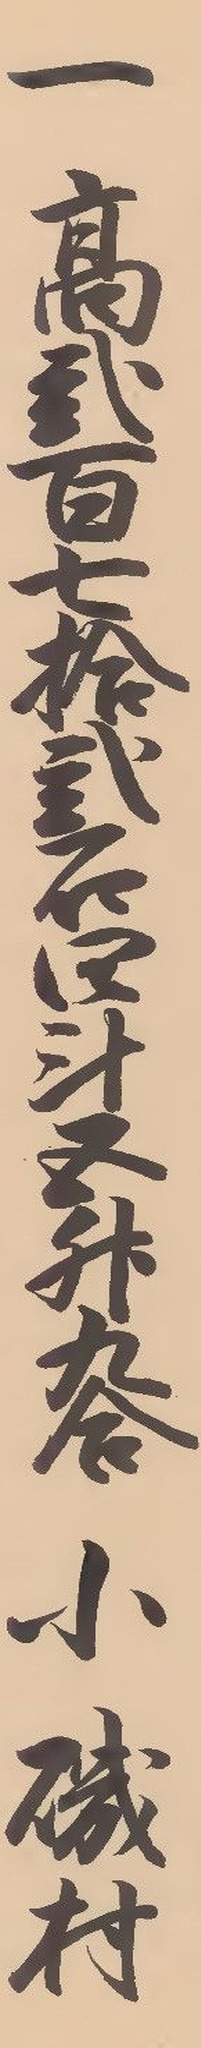一高弐百七拾弐石四斗五升九合小磯村
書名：讃岐国郷帳
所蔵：国立公文書館 National Archives of Japan
